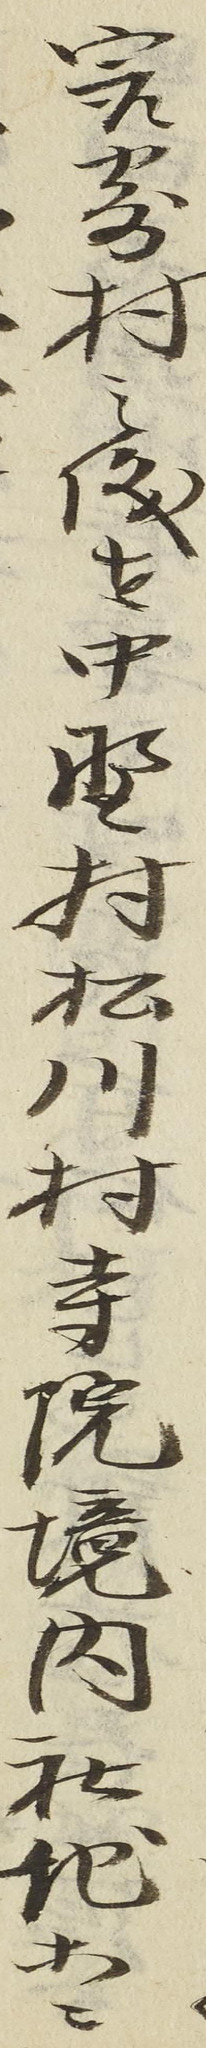最寄村々之儀は中野村松川村寺院社地境等二
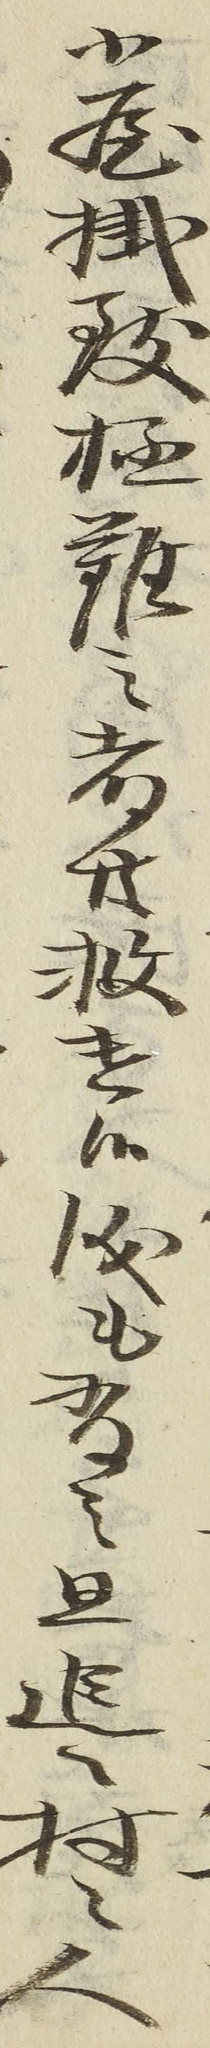小屋掛致極難之者共救遣候儀も有之且追々村々人
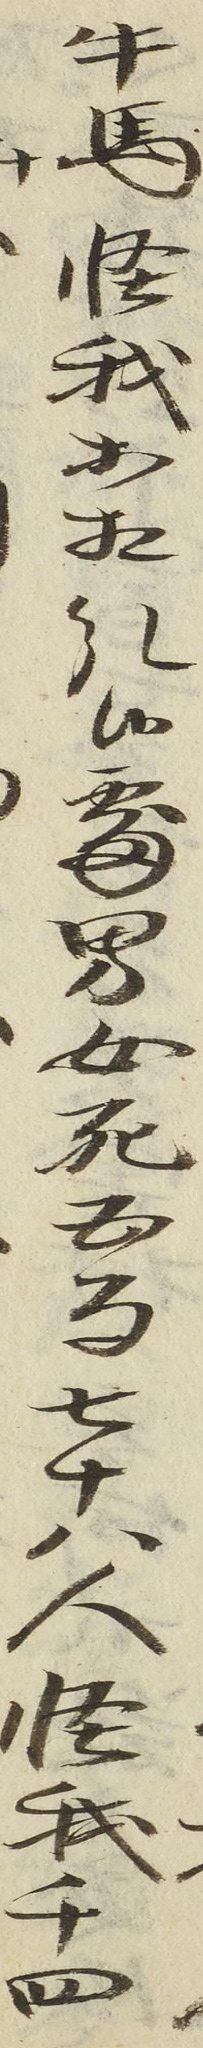牛馬怪我人相糺候処男女死五百七十八人怪我千四
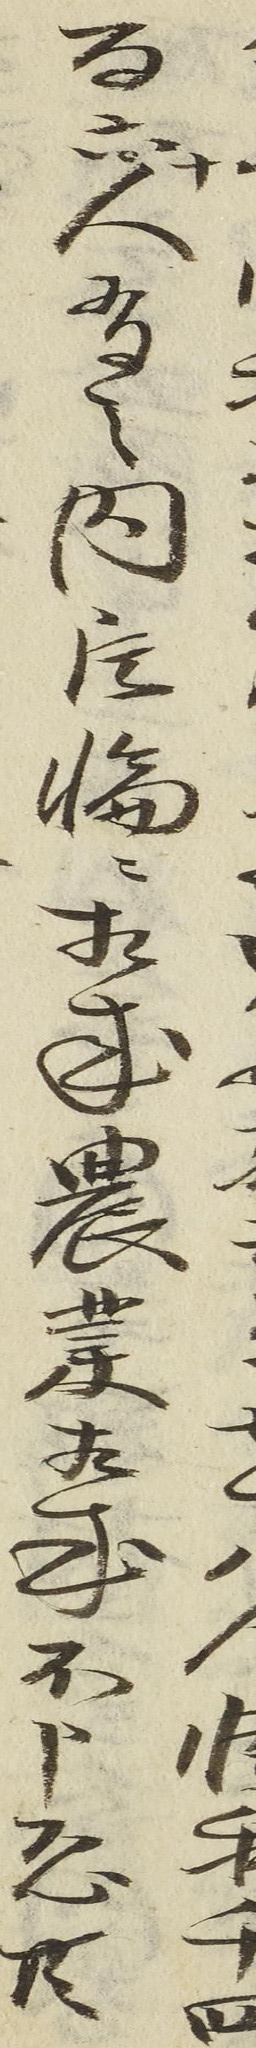百六十人有之内片輪二相成農業相成不申者共
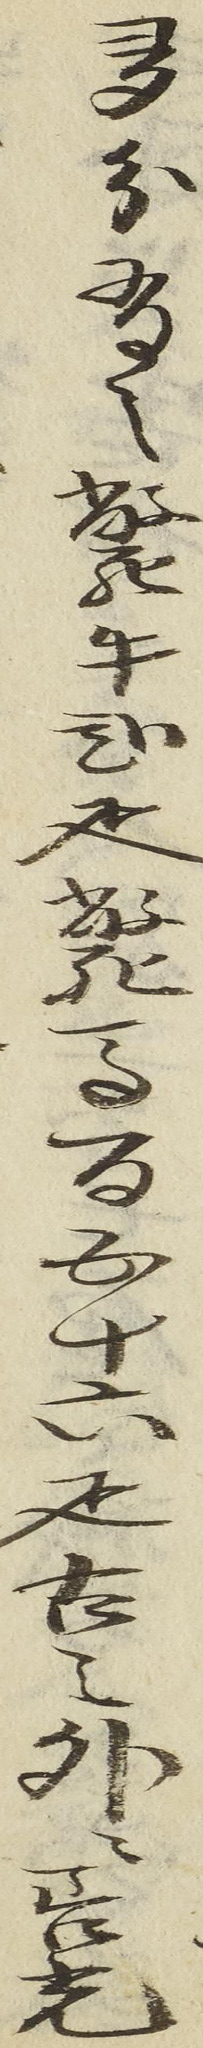多分有之斃牛弐疋斃馬百五十六疋右之外二善光
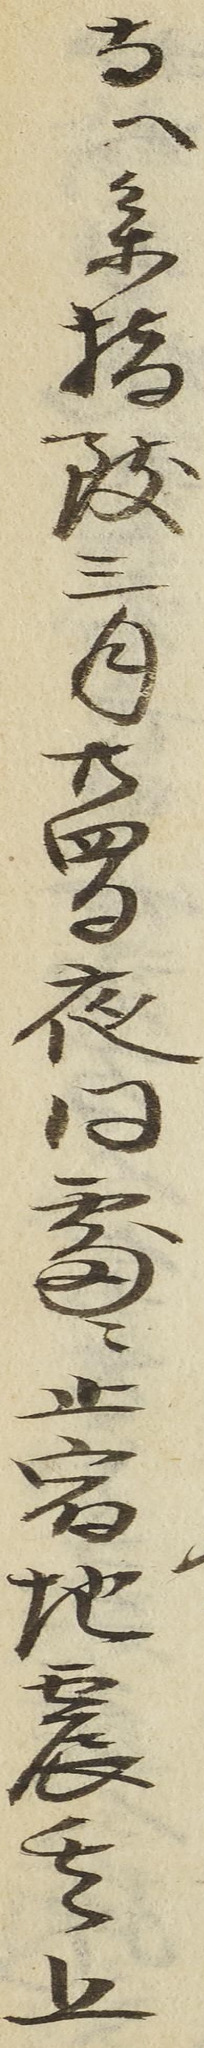寺へ参詣致三月廿四日夜同処二止宿地震其上

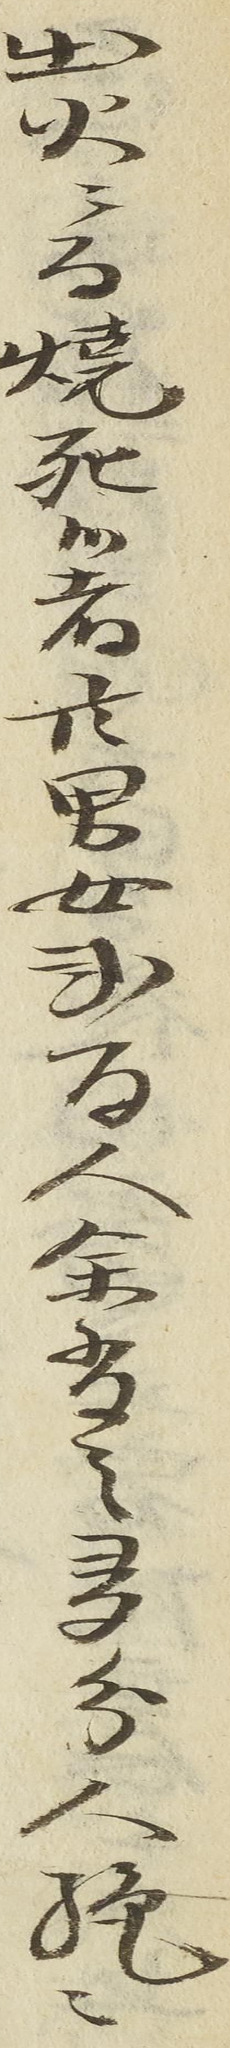出火二而焼失候者共男女弐百人余有之多分人絶二
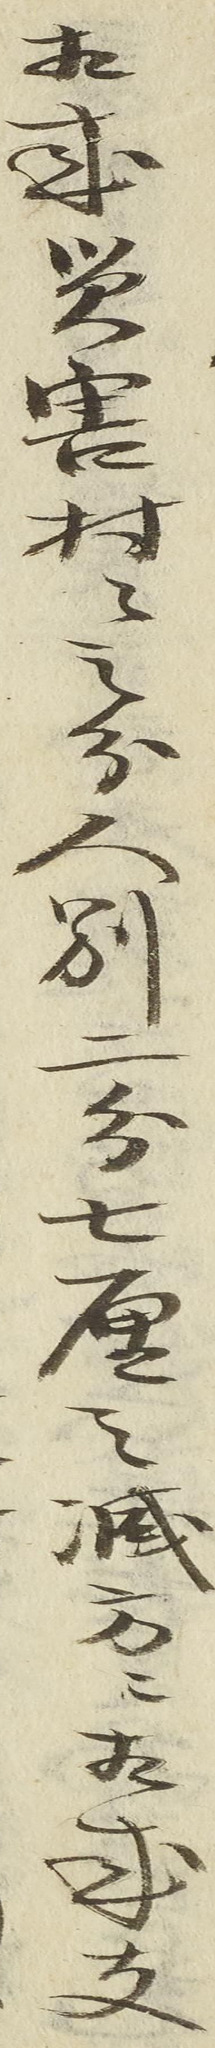相成災害村々之分人別弐分七厘之減高二相成支
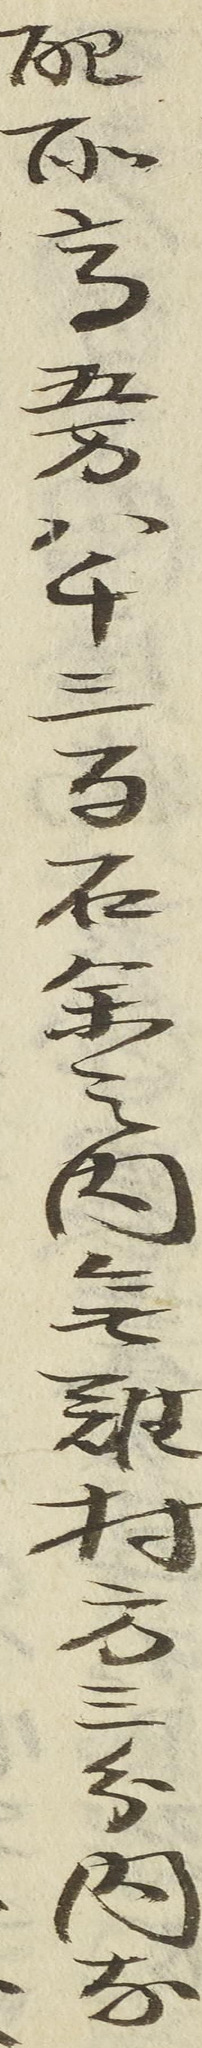配所高五万八千三百石余之内無難村方三分内な
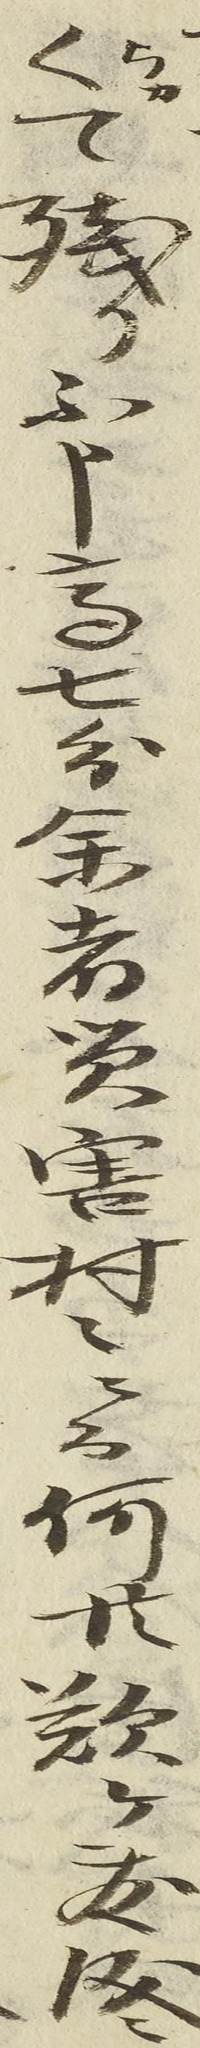らで残り不申高七歩分余は災害村々二而何共嘆ヶ敷儀二
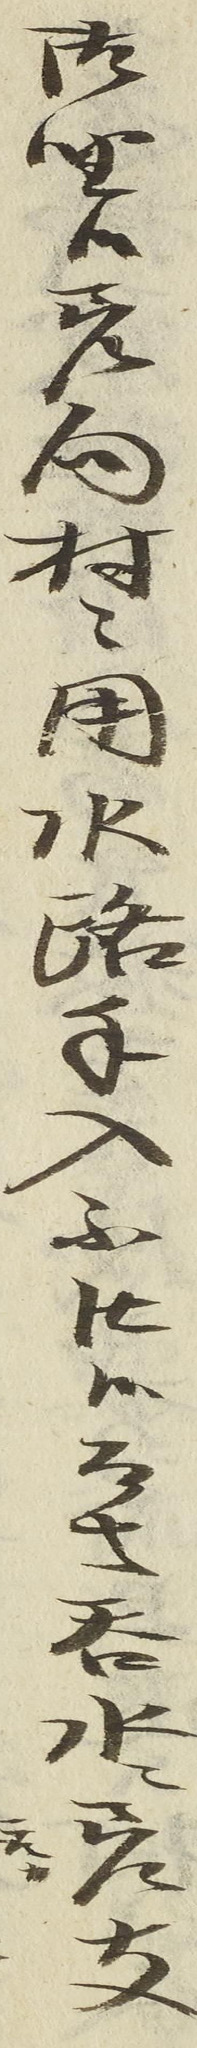御座候差向村々水路手入不仕候而ハは呑水二差支
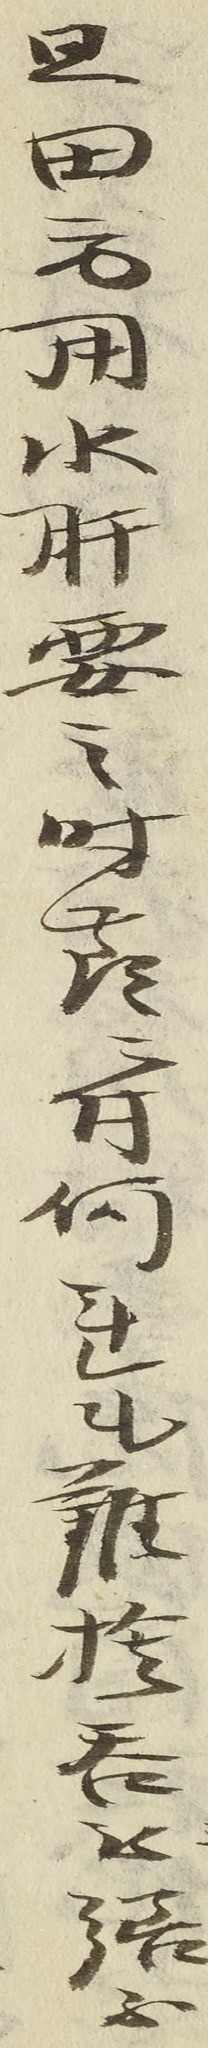且田方用水肝要之時節二付何れも難捨被繕不
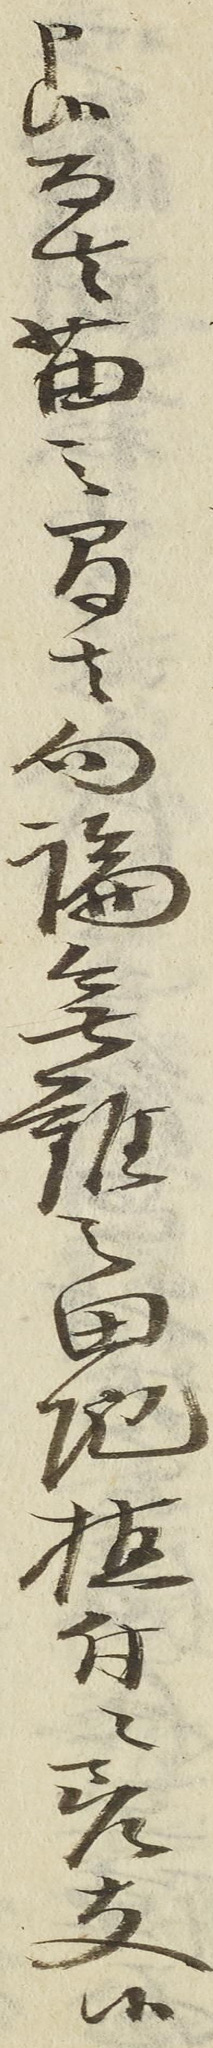申候而は苗之間ハは勿論無難之田地植付二差支候
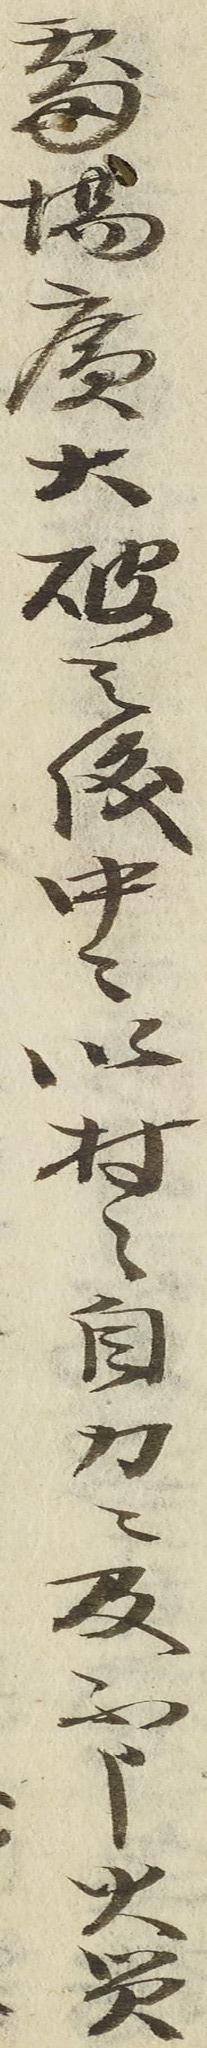処場廣大破之儀中々以村々自力二及不申火災
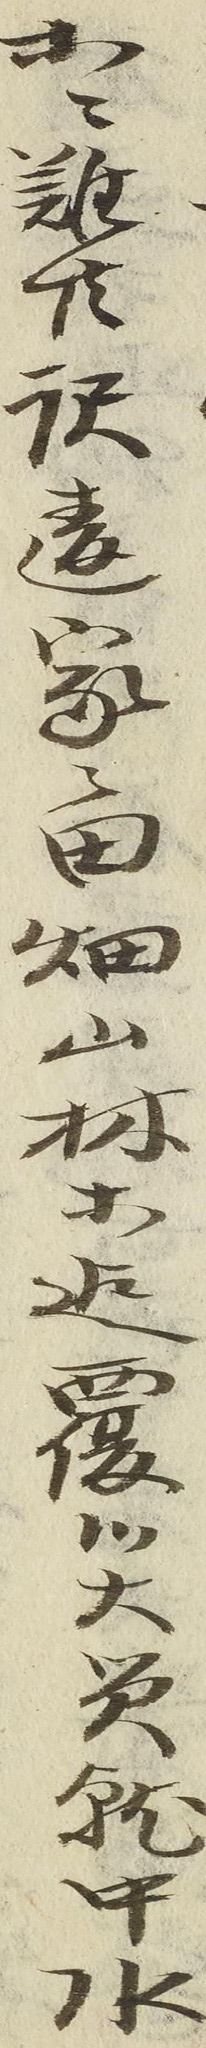等之二難共訳違家々田畑山林等迄覆候大災就中水
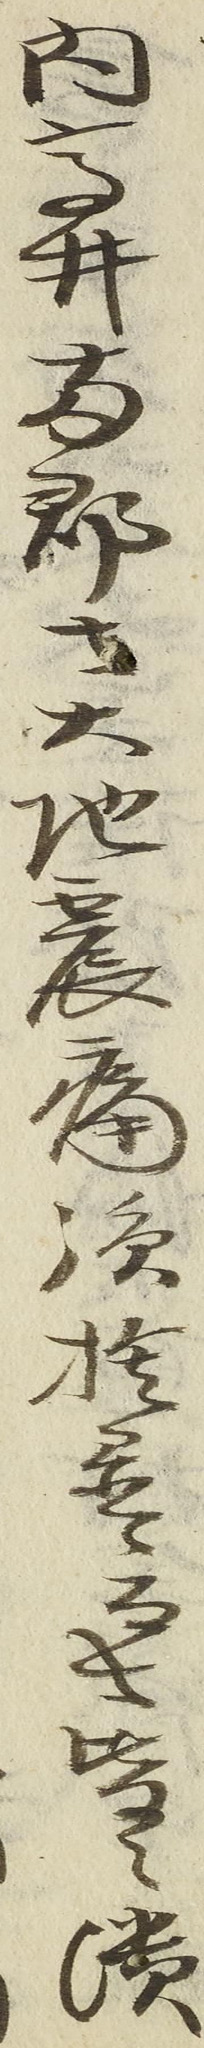内高井両郡は大地震痛強捨置候而は皆々潰
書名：信濃國大地震記　乾
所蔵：東京大学地震研究所図書室 Earthquake Research Institute Library, The University of Tokyo, JAPAN
